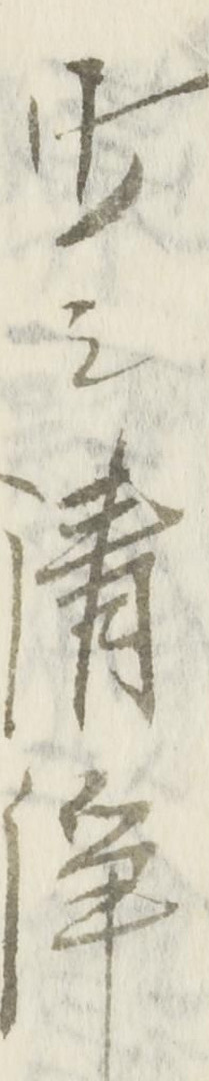少シ清浄
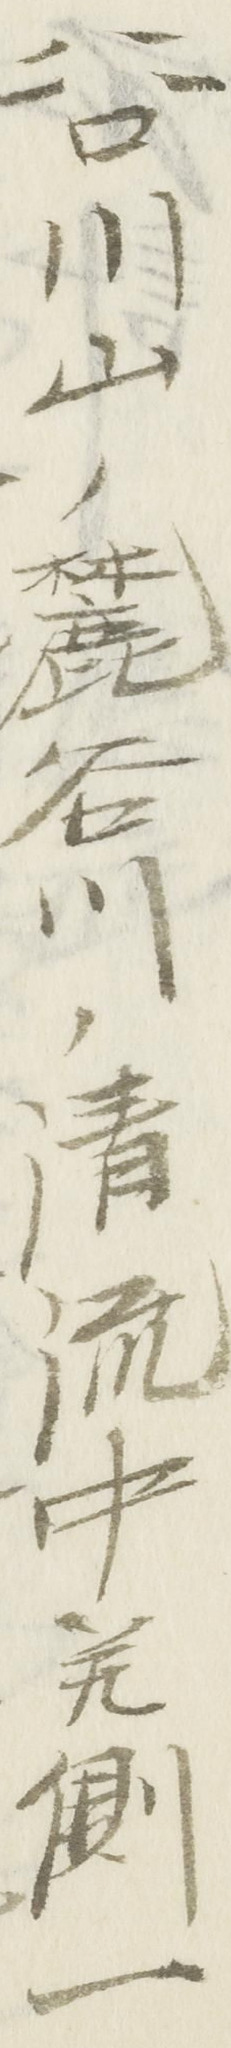谷川山ノ麓谷川ノ清流中并側一
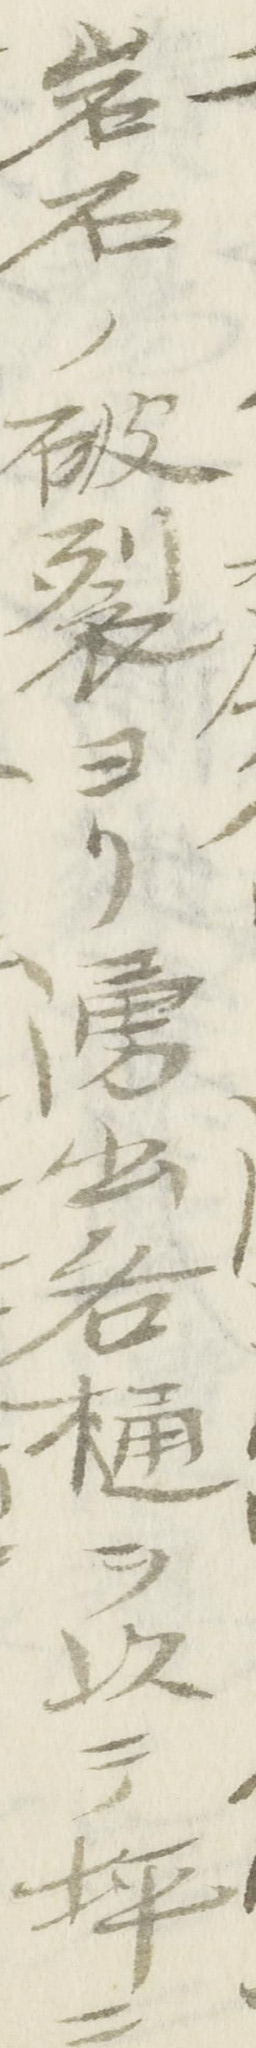岩石ノ破裂ヨリ湧出各樋ヲ以テ坪
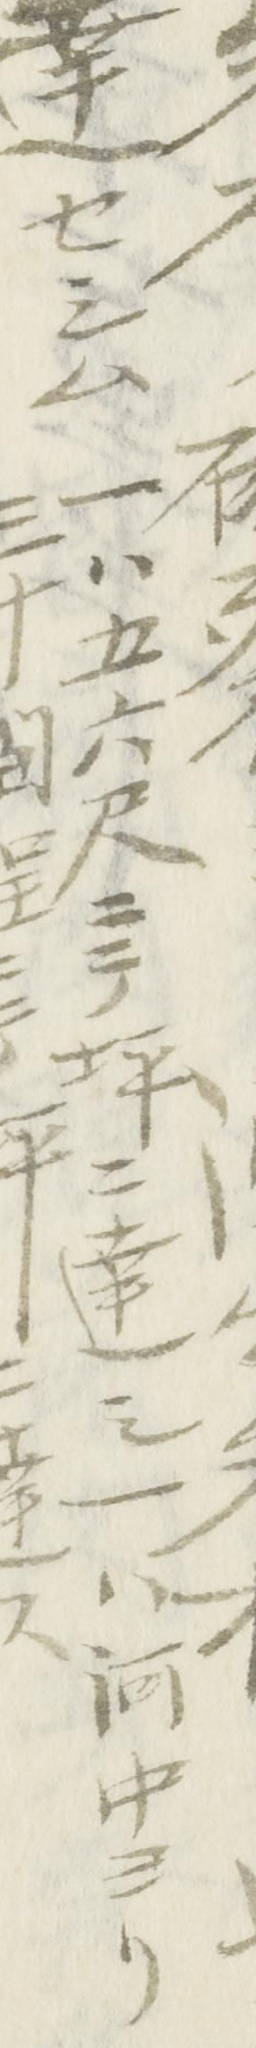達セシム一ハ五六尺ニテ坪ニ達シ一ハ河中ヨリ
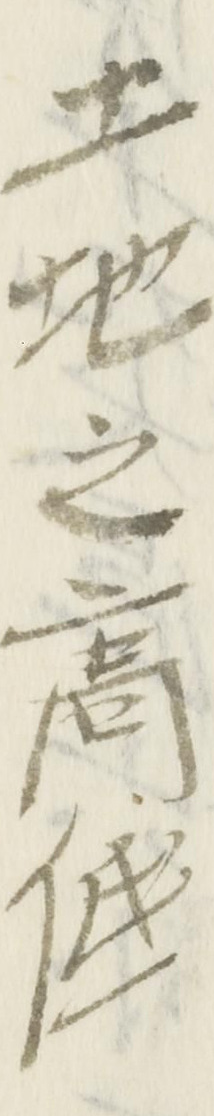土地之高低
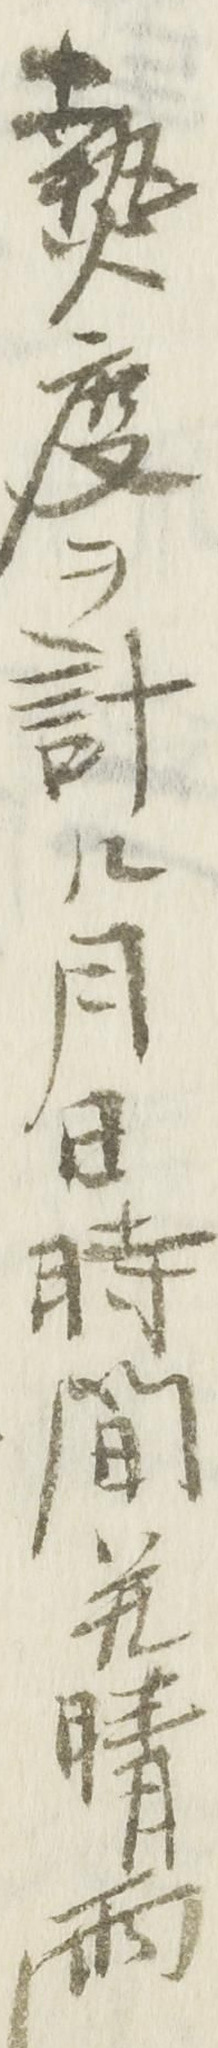熱度ヲ計ル月日時間并晴雨
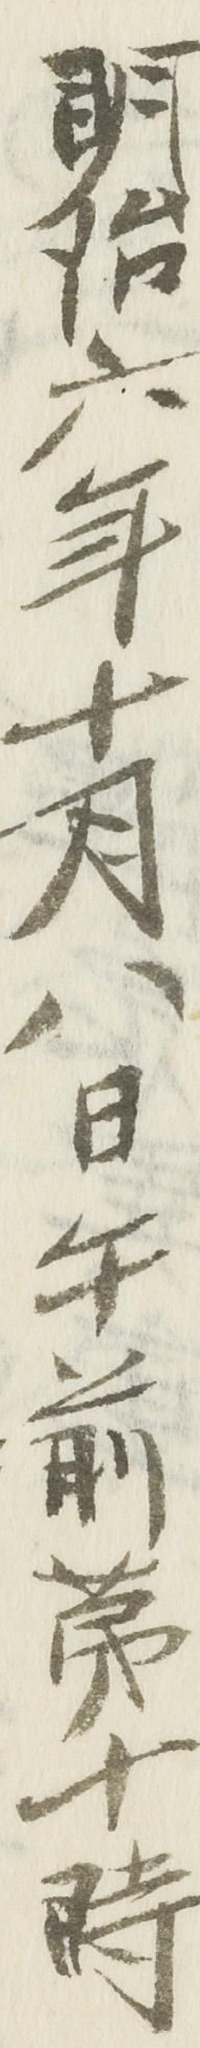明治六年十月八日午前第十時
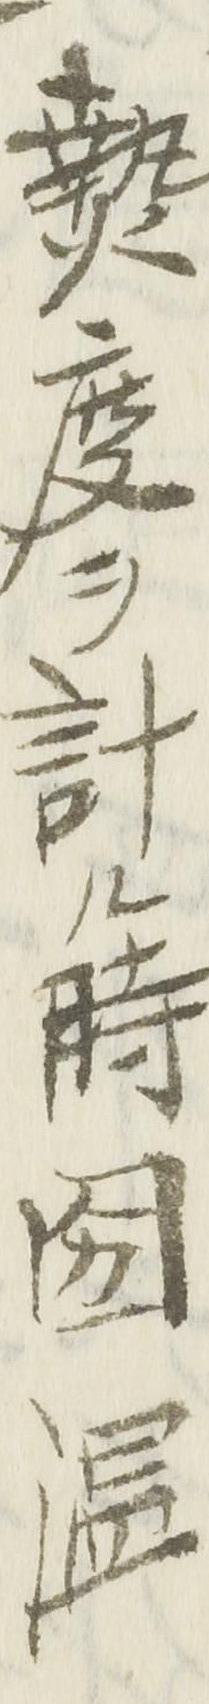熱度ヲ計ル時分温
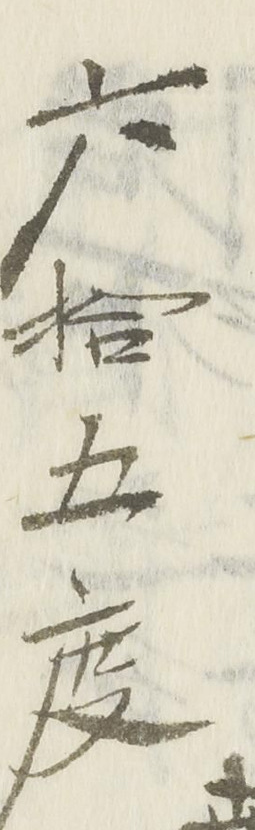六拾五度
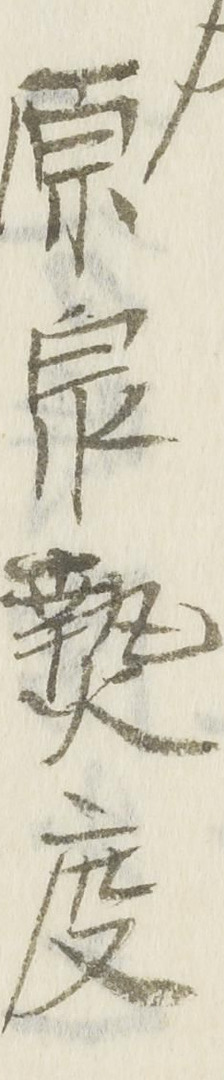原泉熱度
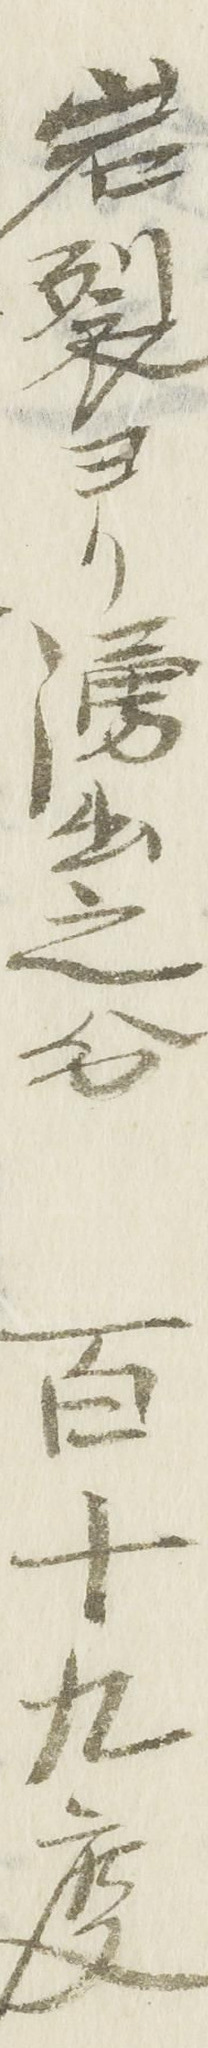岩裂ヨリ湧出之谷百十九度
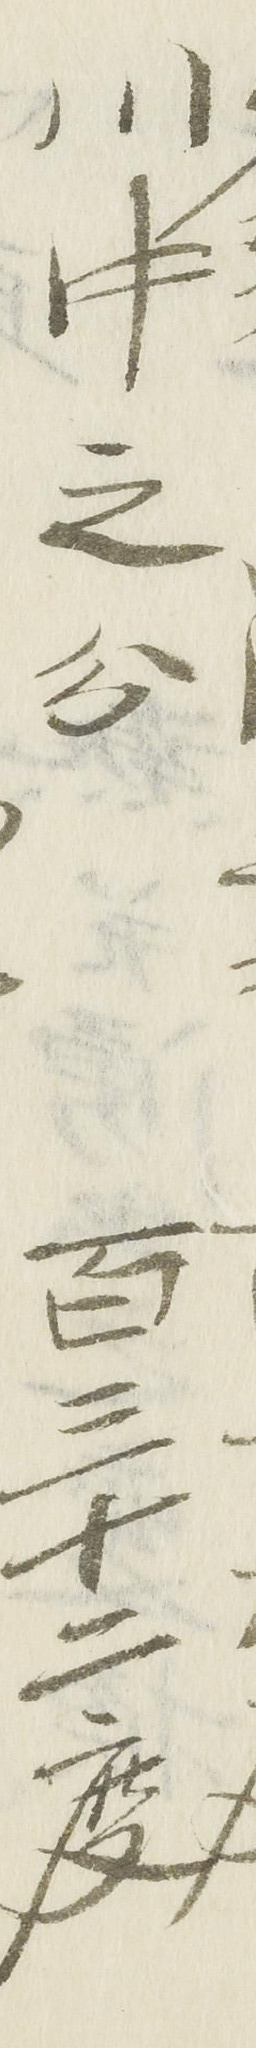川中之分百三十二度

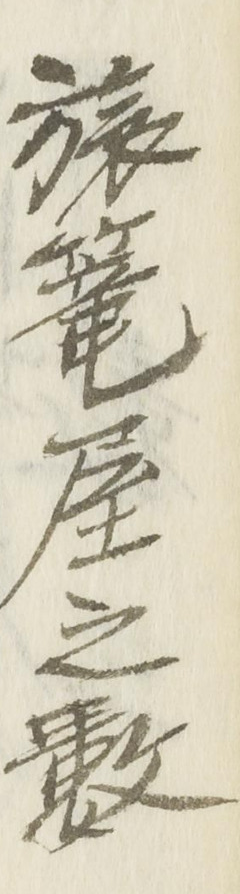旅籠屋之数
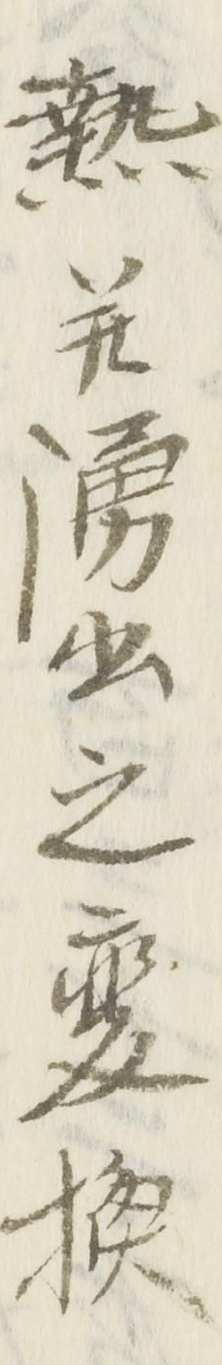熱并湧出之変換
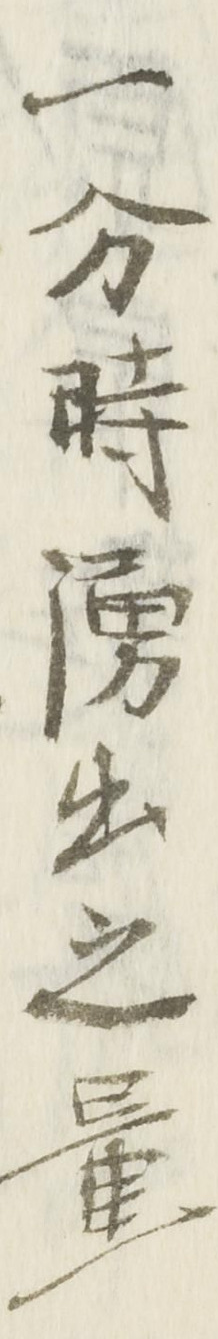一分時湧出之量
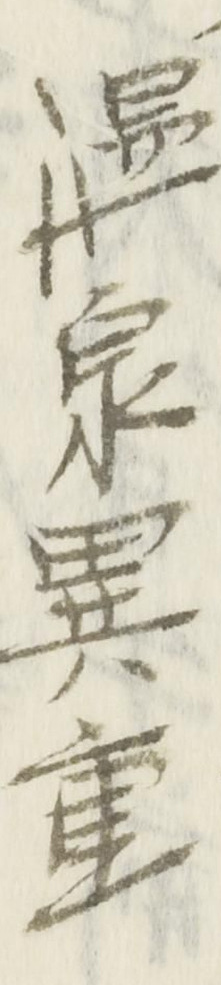温泉異重
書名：温冷泉試験表
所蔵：東京大学地震研究所図書室 Earthquake Research Institute Library, The University of Tokyo, JAPAN
